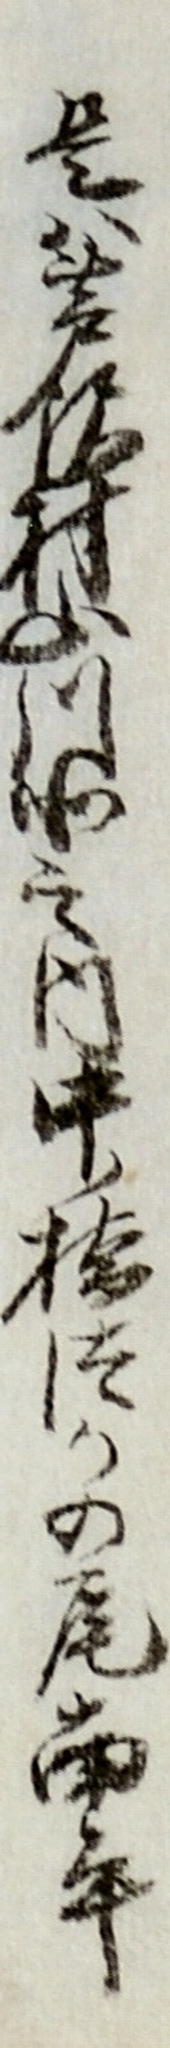是ハ芦沢村山川北之内中ノ橋つかの尾南平
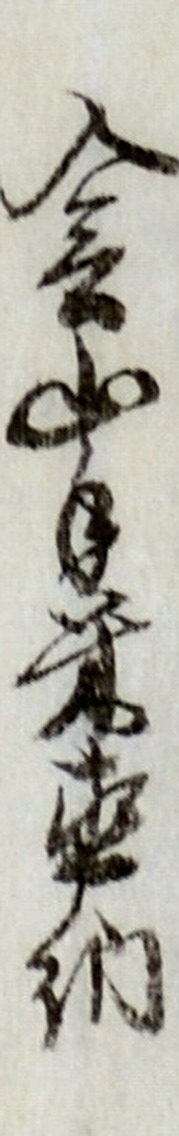入会山手米直納
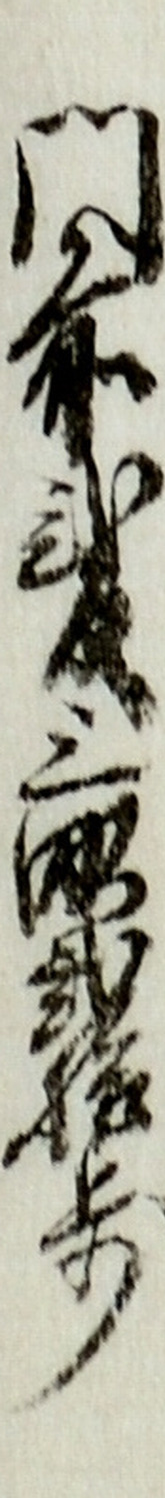門前弐反三畝弐拾歩同寺
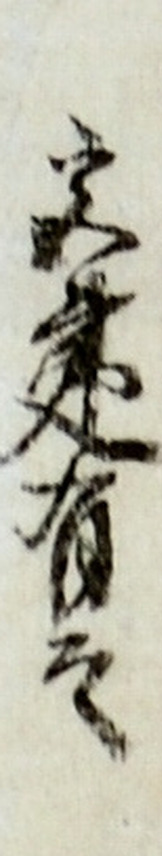宮建有之
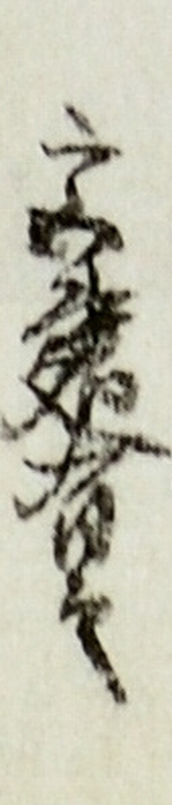宮建有之
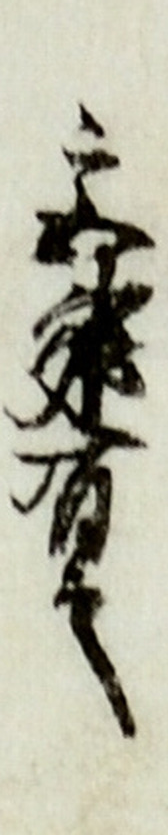宮建有之
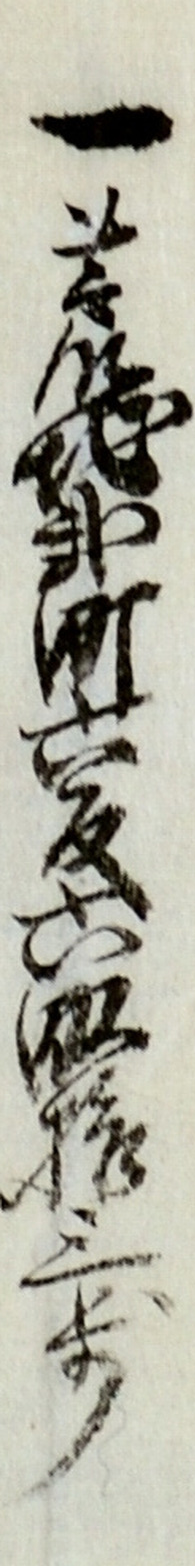一荒地弐町六反六畝拾三歩村中
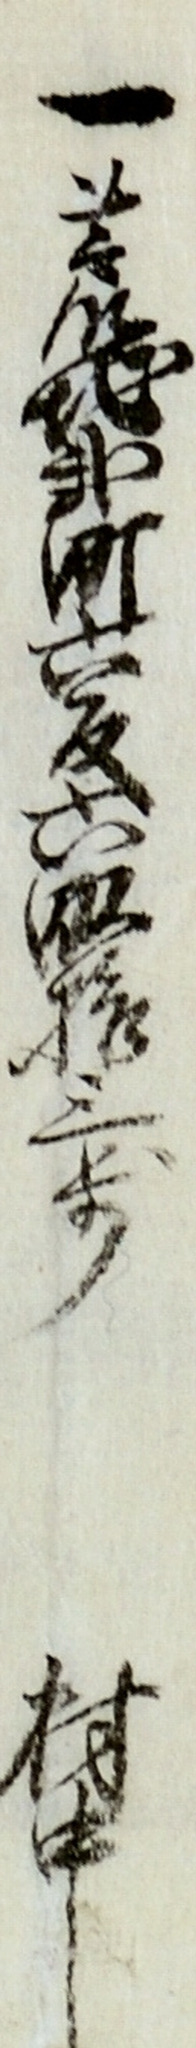一荒地弐町六反六畝拾三歩村中
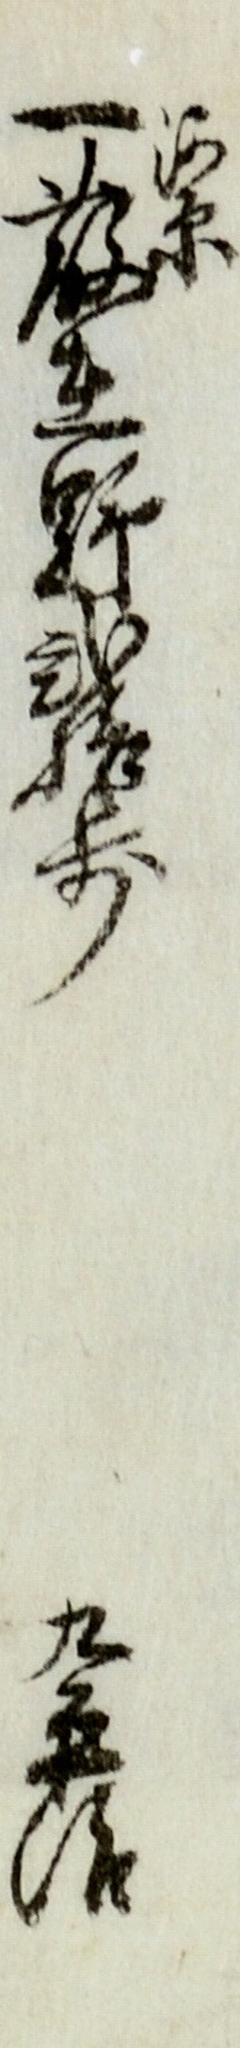一散在野弐拾歩九平治
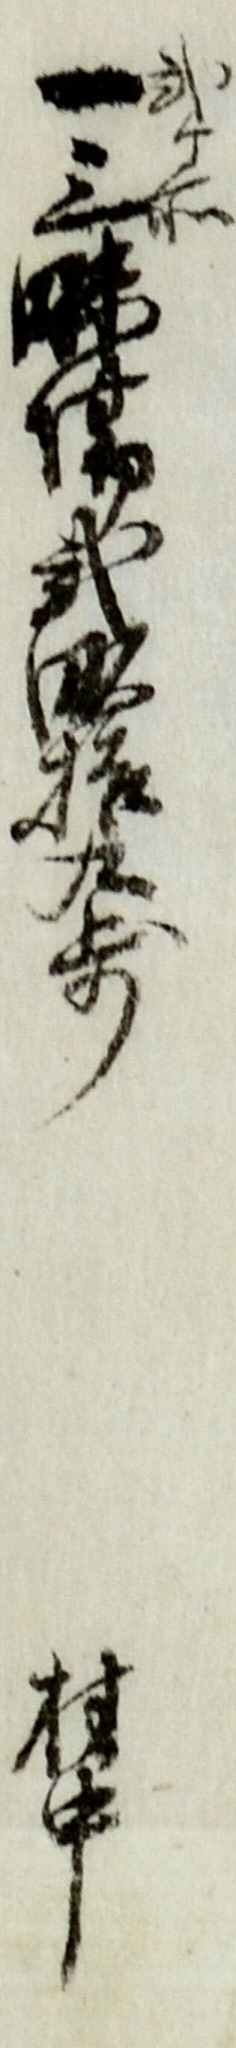一三昧場弐畝拾九歩村中
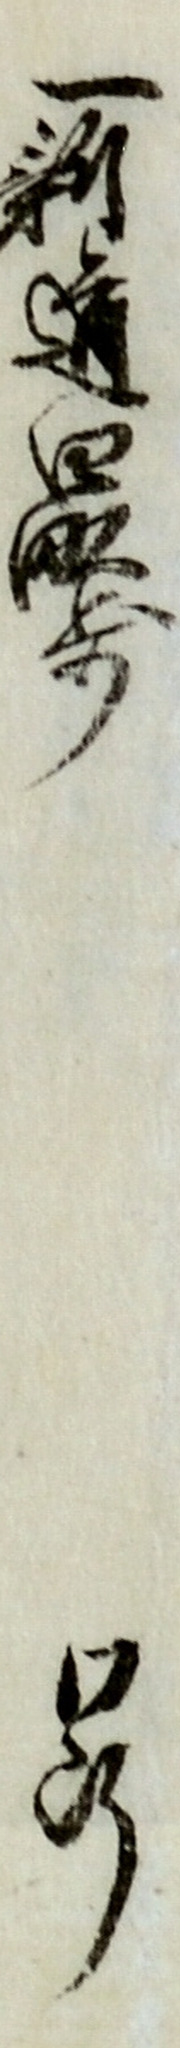一新道四畝歩同断
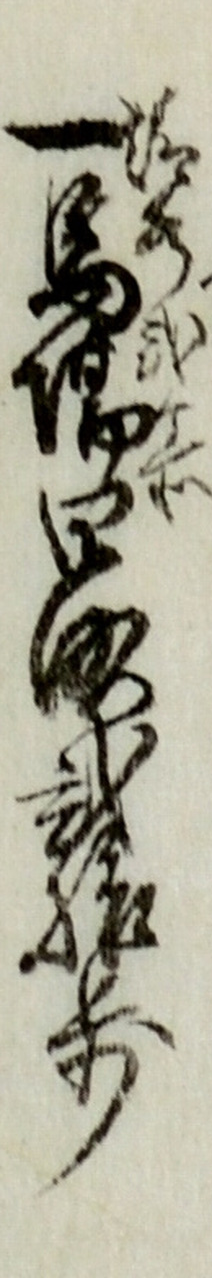一馬場四畝弐拾歩

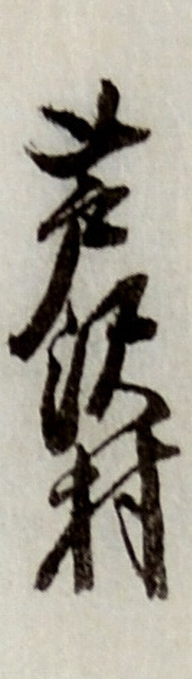芦沢村
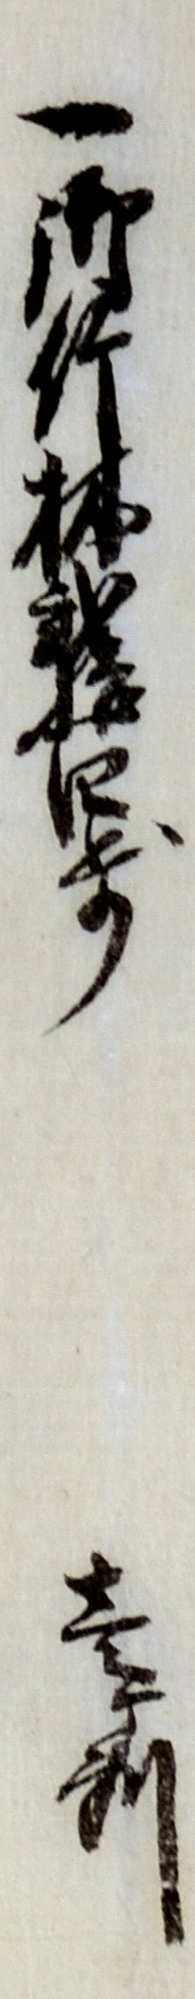一御竹林弐拾四歩壱ヶ所
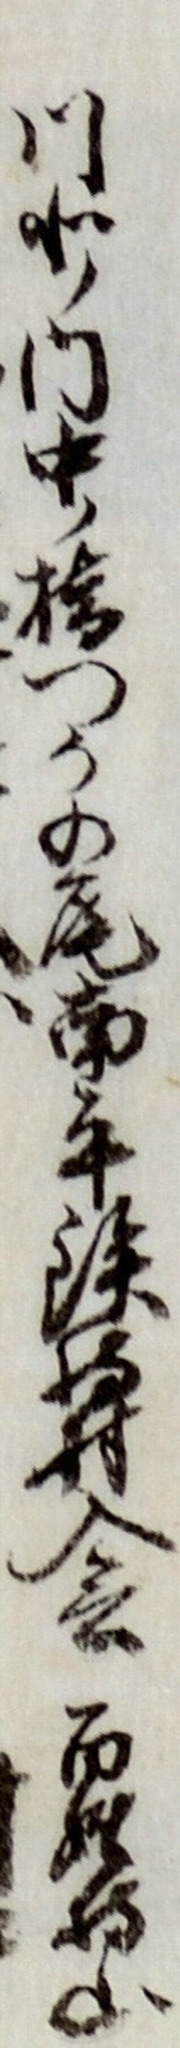川北ノ内中ノ橋つかの尾南平鉾持村入会百姓持山
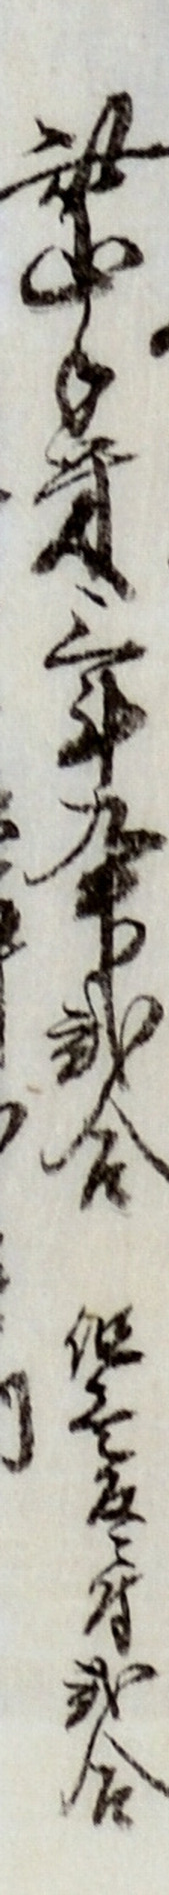此山手米三斗九升弐合但壱反ニ付弐合
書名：御領分中山林社地手控
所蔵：伊那市立高遠町図書館・合同会社AMANE
